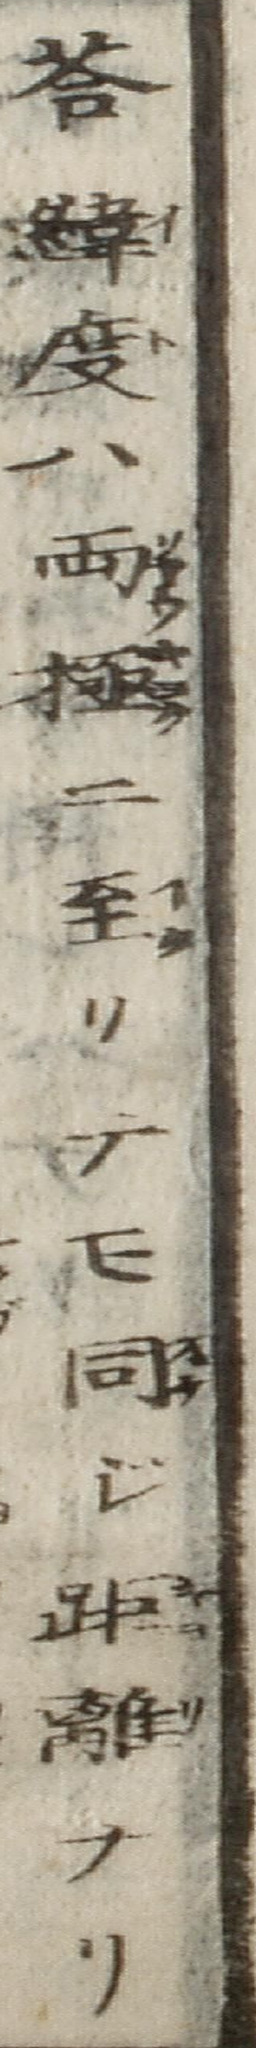答緯度ハ両極ニ至リテモ同ジ距離ナリ
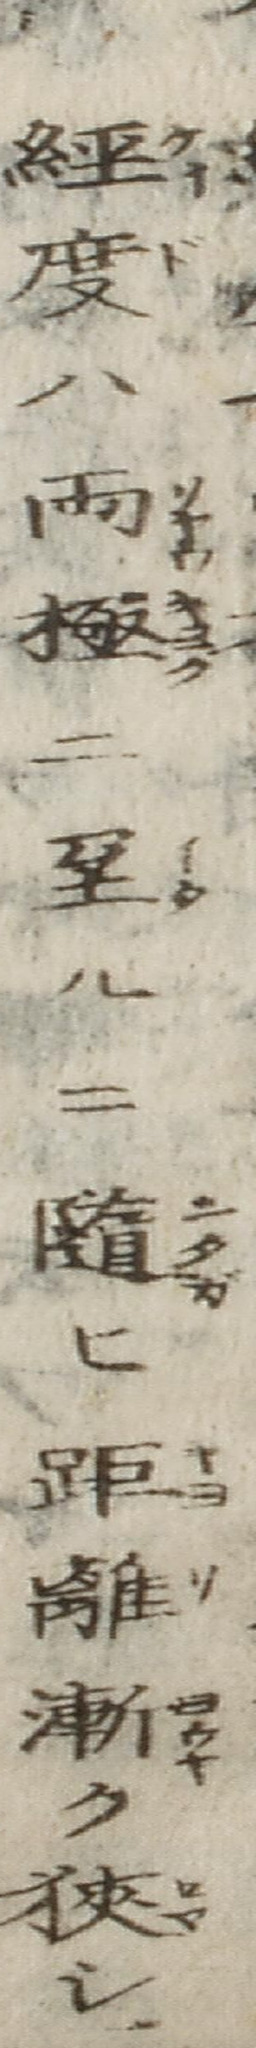経度ハ両極ニ至ルニ随ヒ距離漸ク狭シ
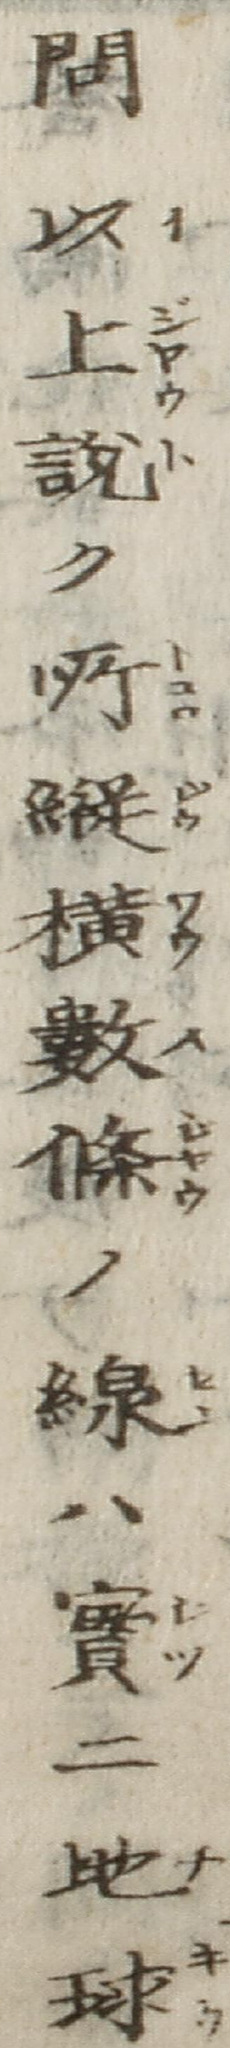問以上説ク所縦横数条ノ線ハ実ニ地球
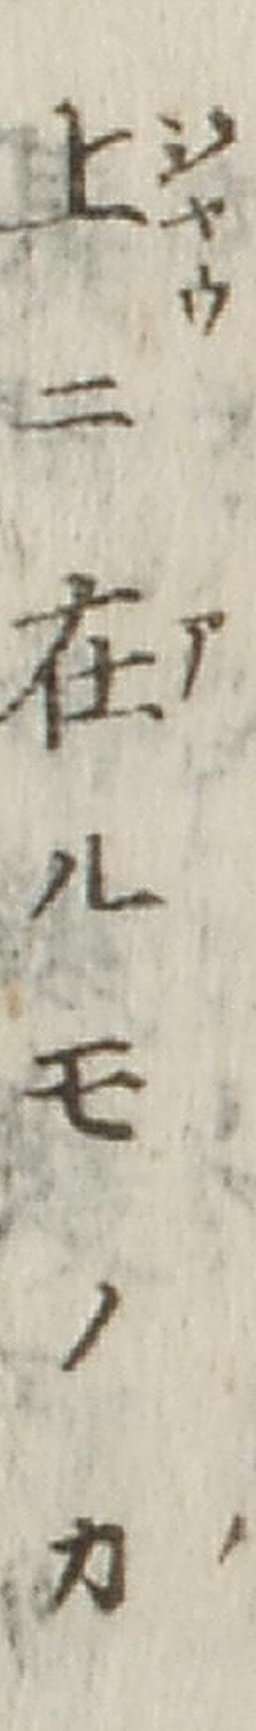上ニ在ルモノカ
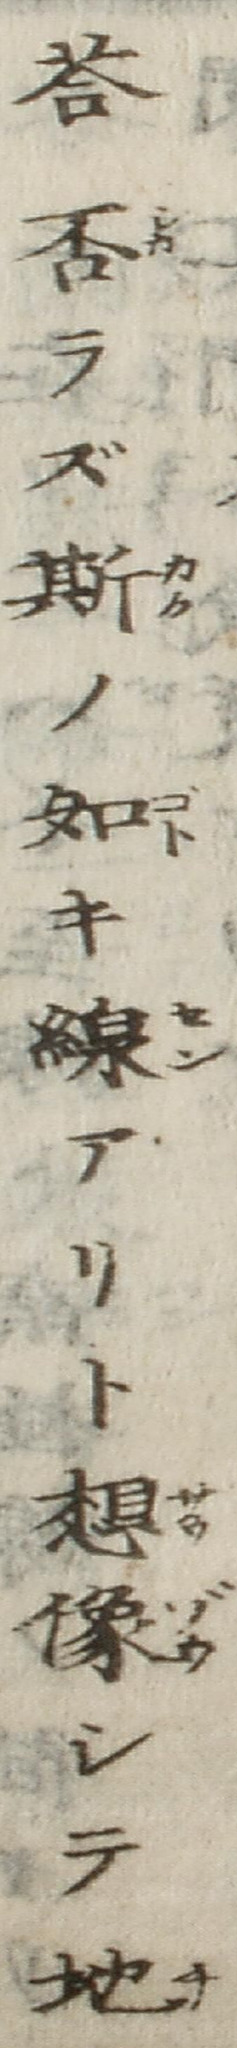答否ラズ斯ノ如キ線アリト想像シテ地
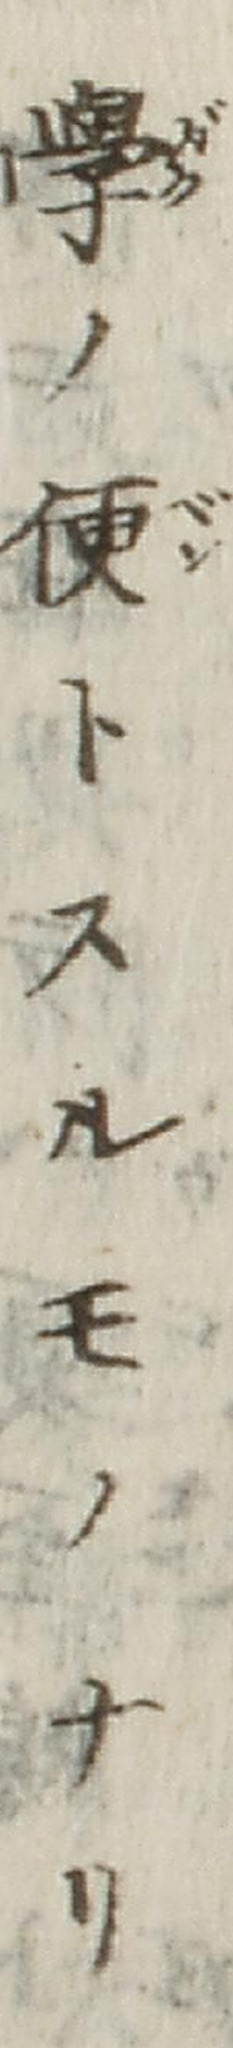学ノ便トスルモノナリ
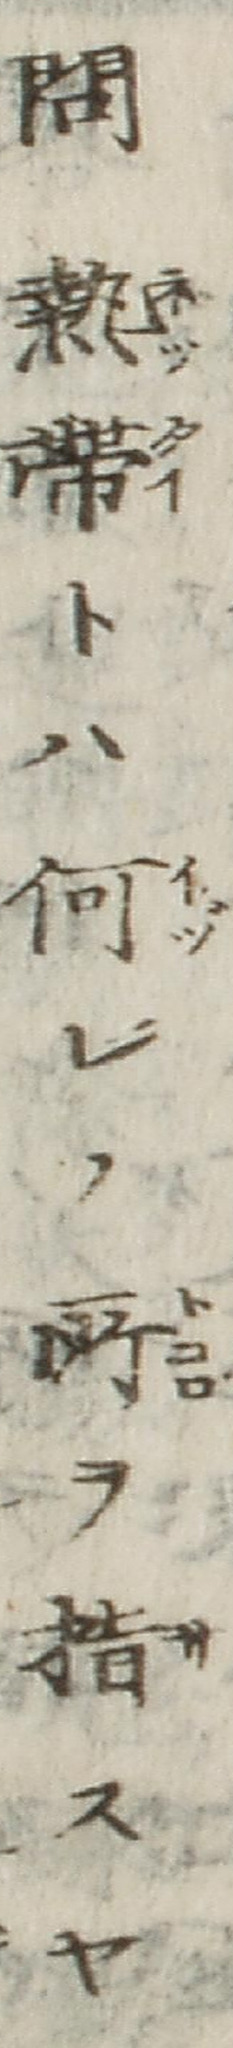問熱帯トハ何レノ所ヲ指スヤ
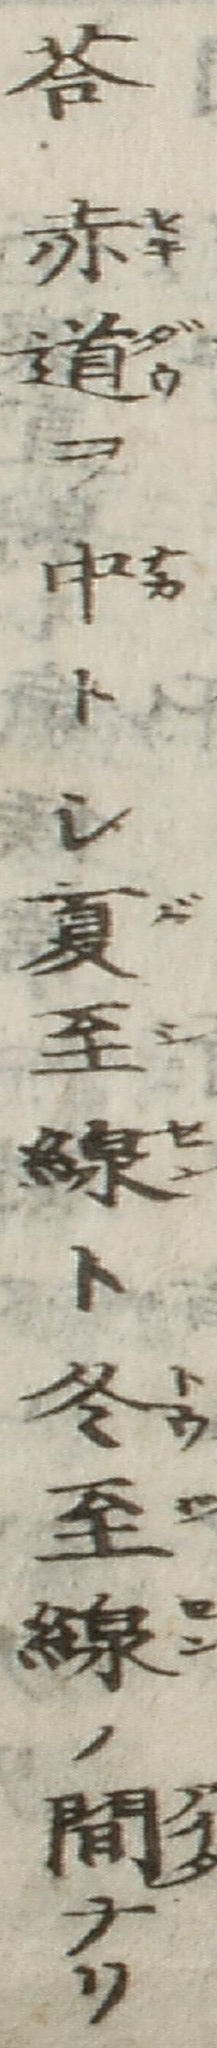答赤道ヲ中トシ夏至線ト冬至線ノ間ナリ
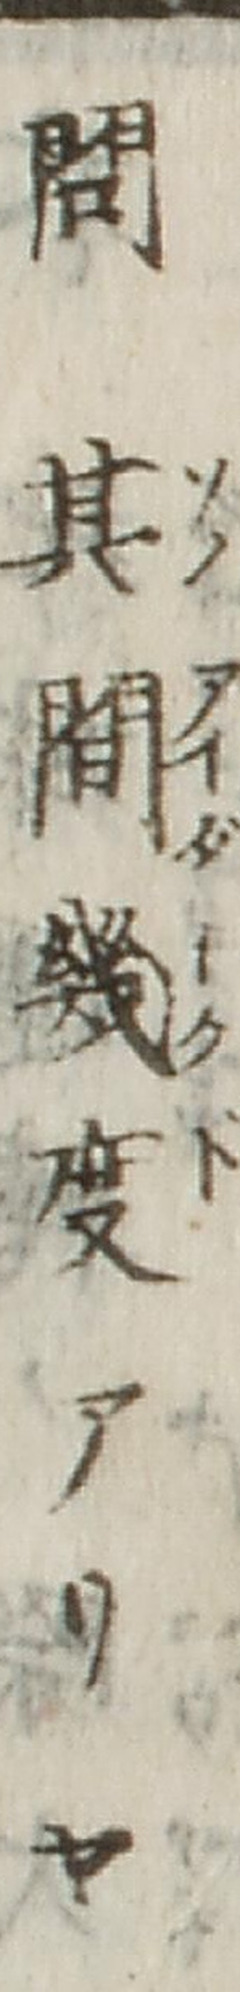問其間幾度アリヤ
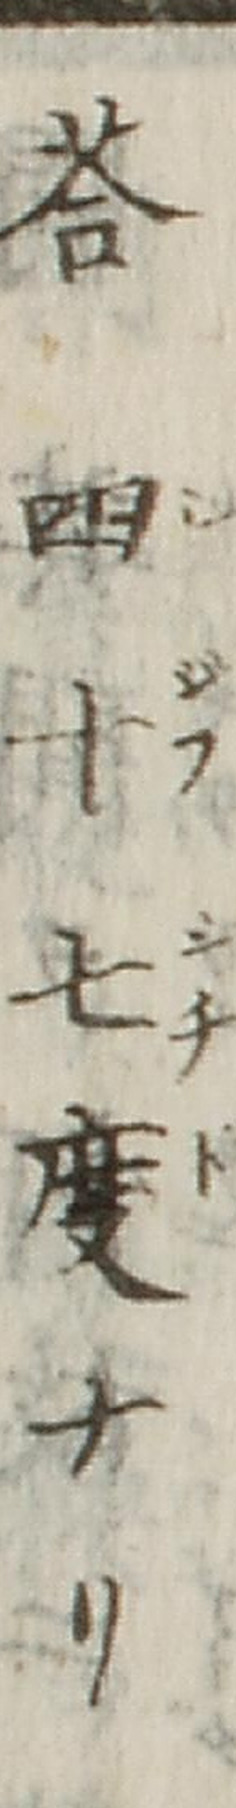答四十七度ナリ

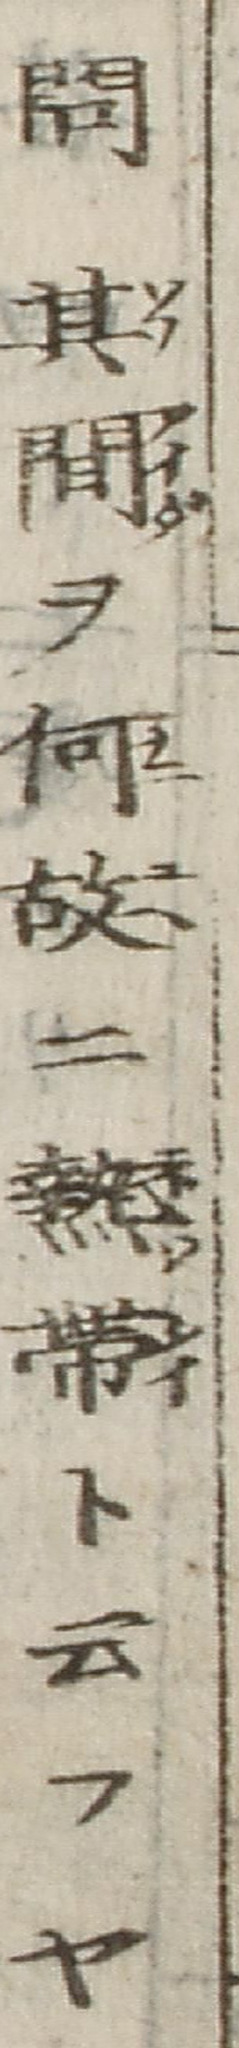問其間ヲ何故ニ熱帯ト云フヤ
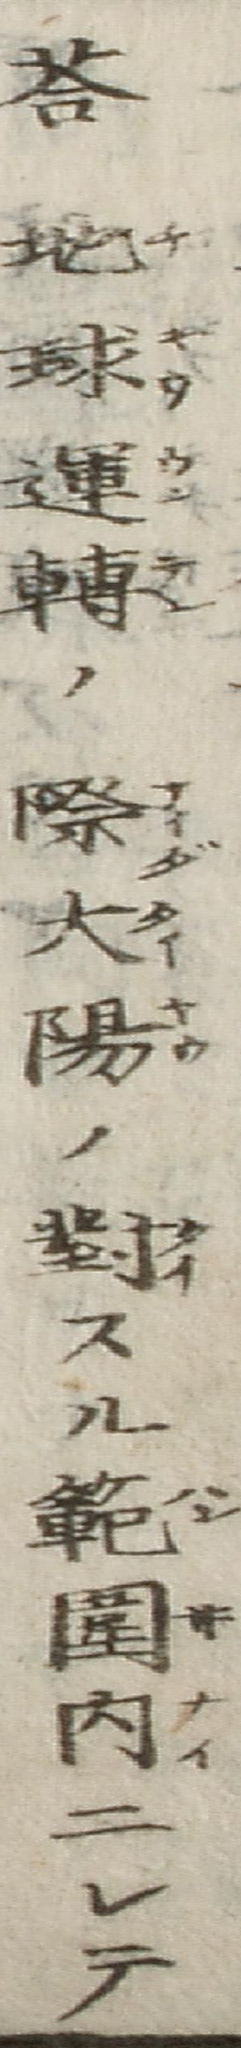答地球運転ノ際大陽ノ対スル範囲内ニシテ
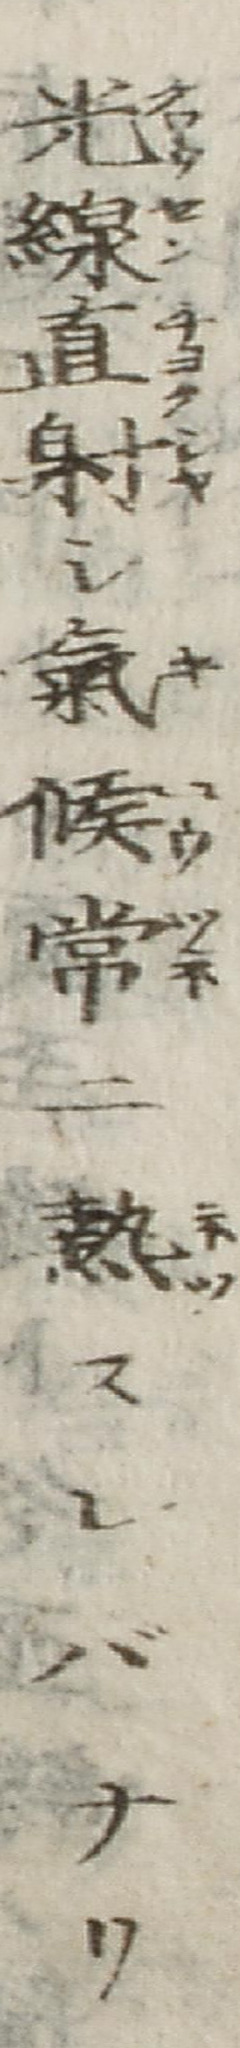光線直射シ気候常ニ熱スレバナリ
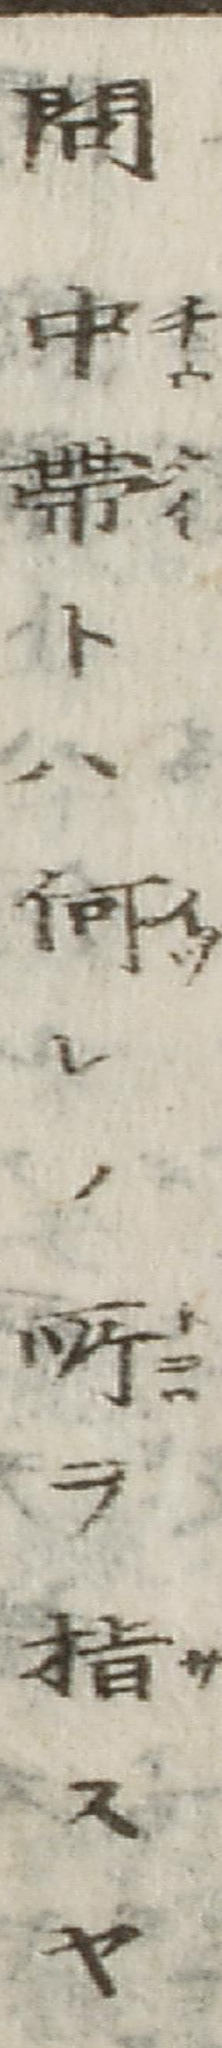問中帯トハ何レノ所ヲ指スヤ
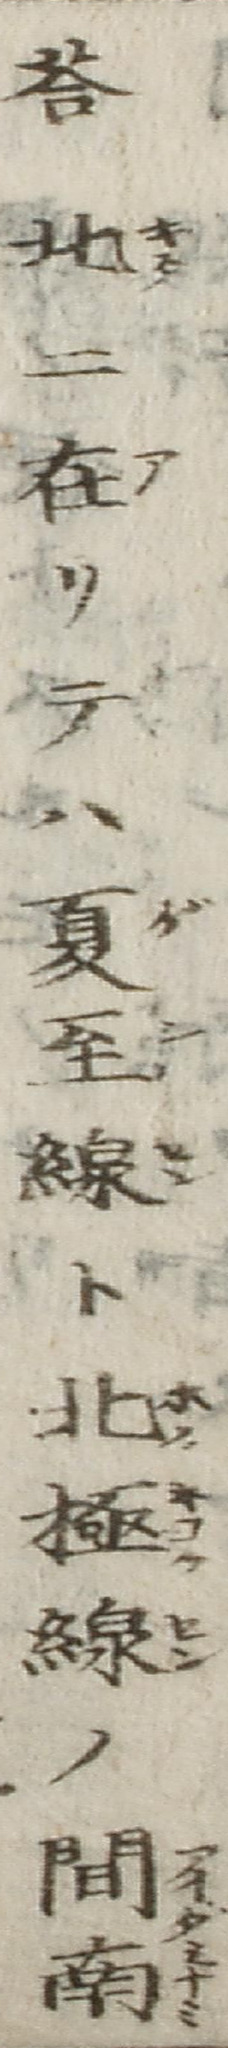答北ニ在リテハ夏至線ト北極線ノ間南
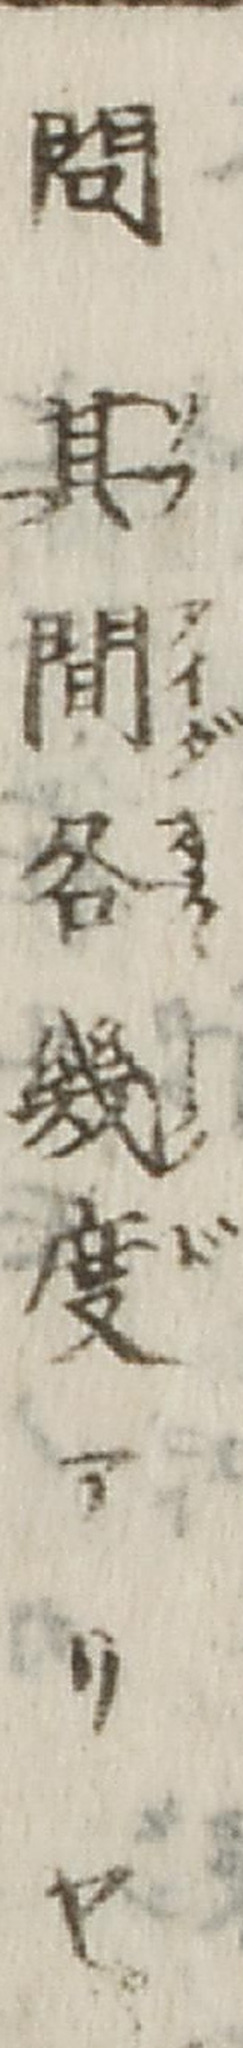問其間各幾度アリヤ
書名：地球儀問答　全
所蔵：東京大学地震研究所図書室 Earthquake Research Institute Library, The University of Tokyo, JAPAN
